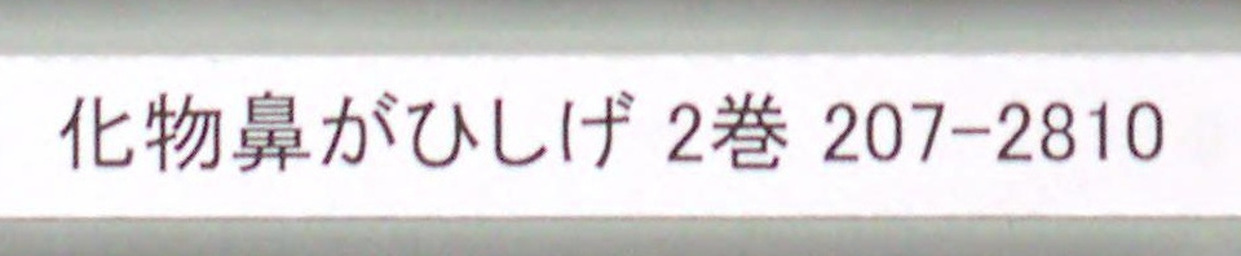化物鼻がひしげ
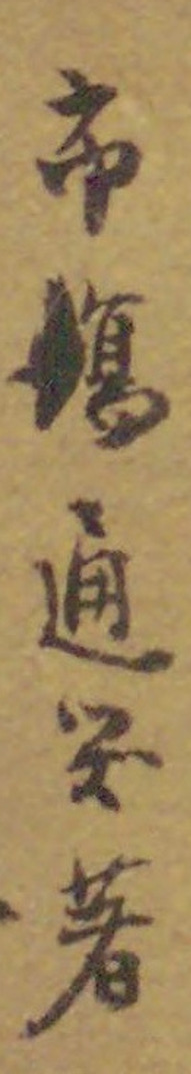市場通笑著
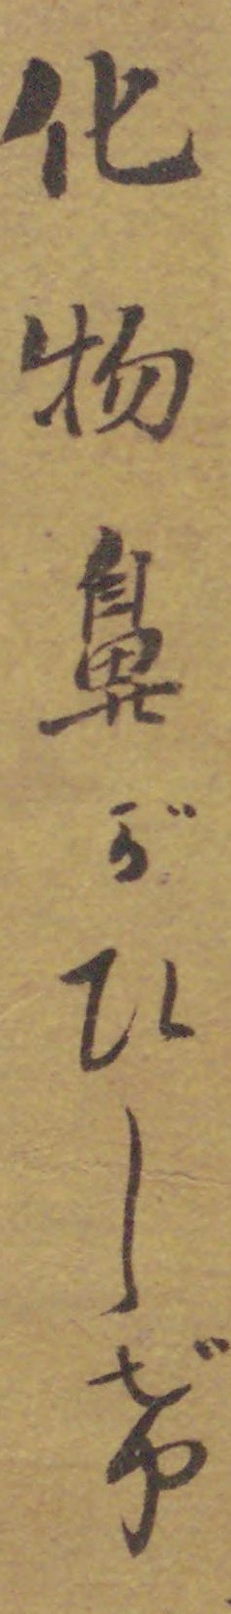化物鼻がひしげ

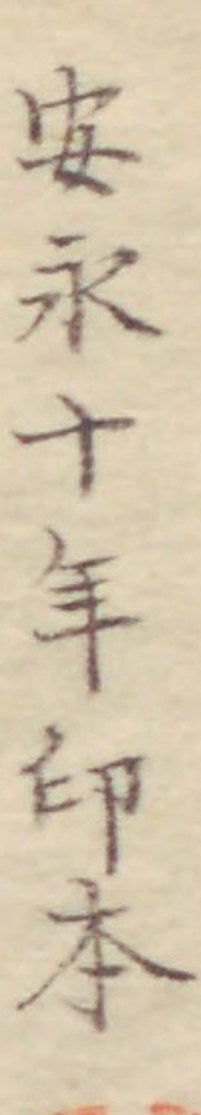安永十年印本
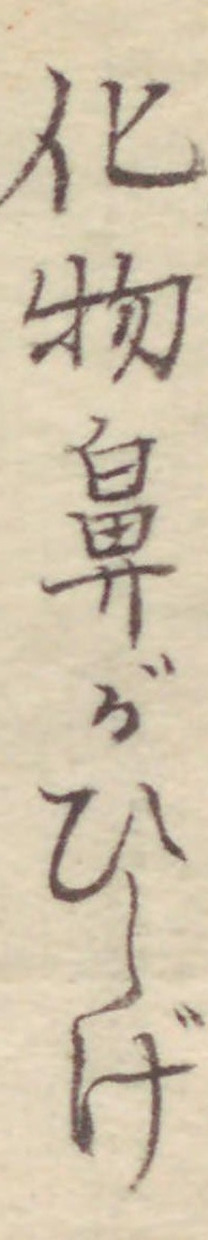化物鼻がひしげ
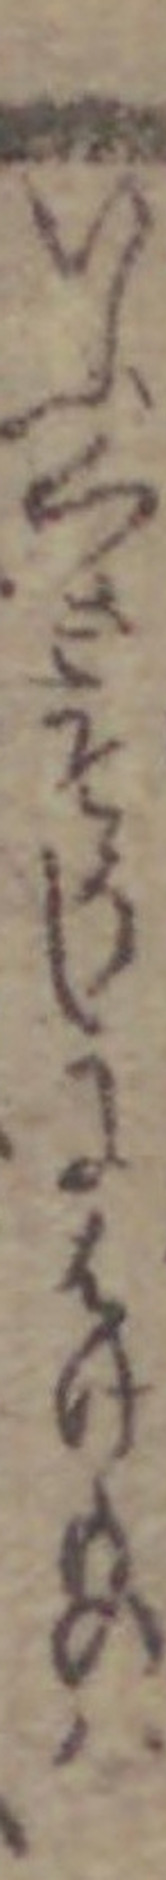いふくさそうしにはけものは
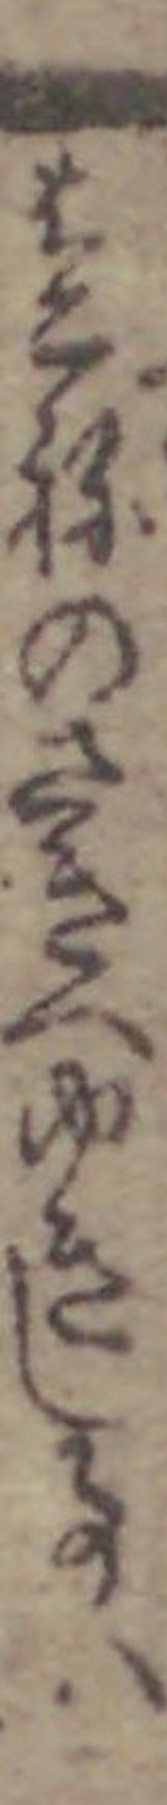はこねのさきへゆきし事は
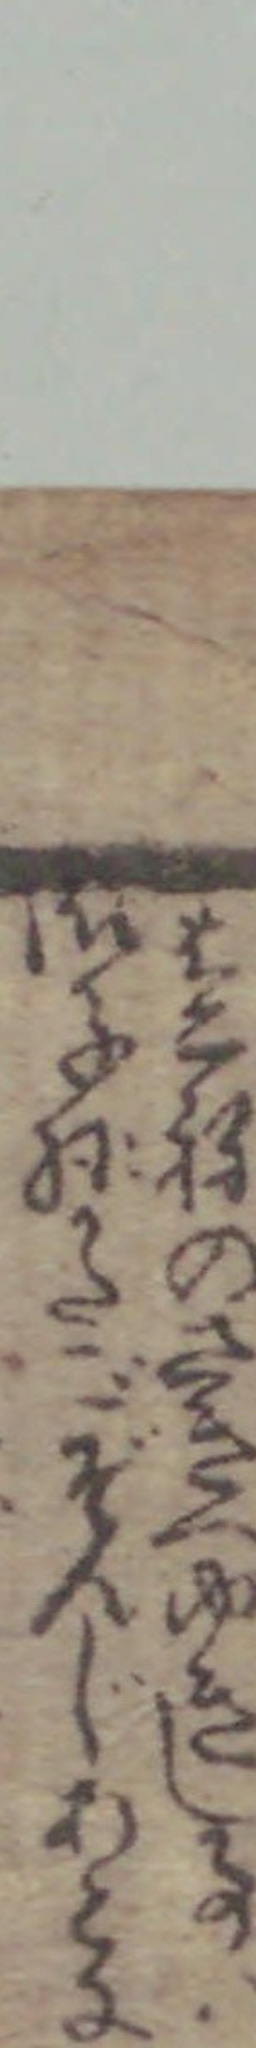御子様かたごぞんじあとに
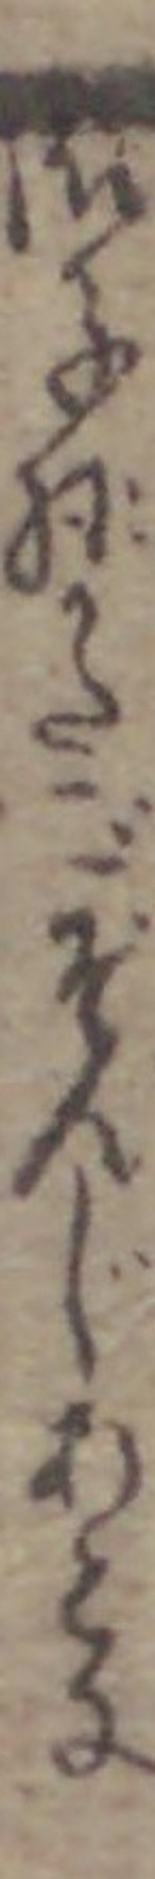御子様かたごぞんじあとに
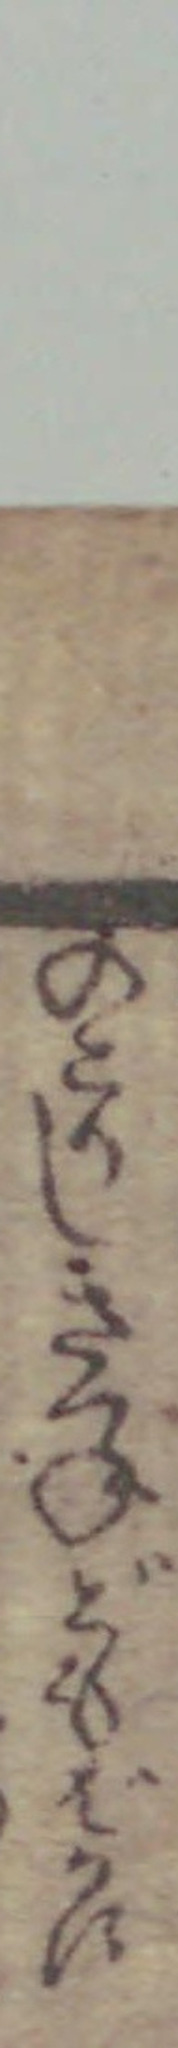のこりしきつねどもばかす
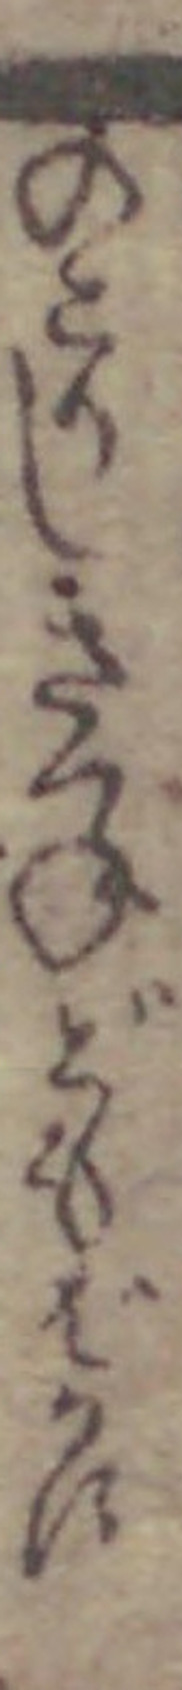のこりしきつねどもばかす
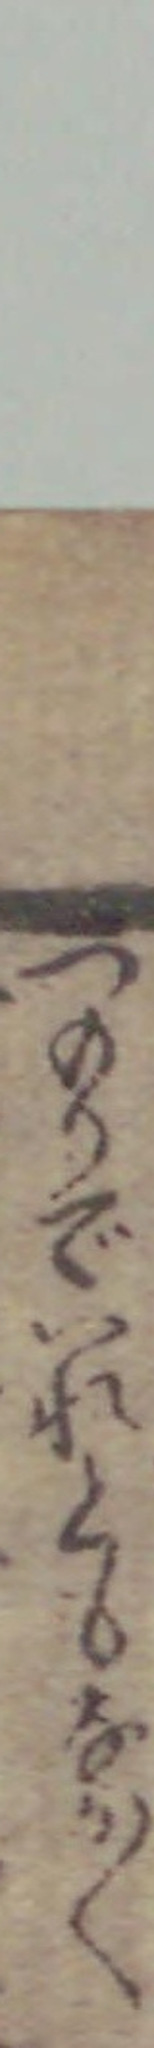つもりでいれともなか〳〵
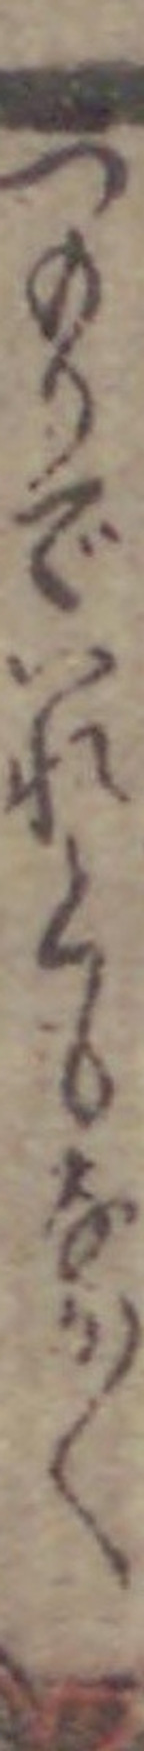つもりでいれともなか〳〵
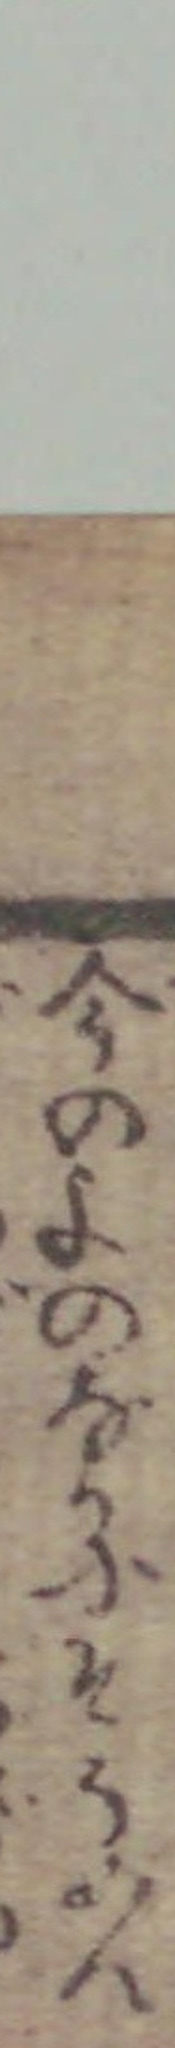今のよのなかにそうめん
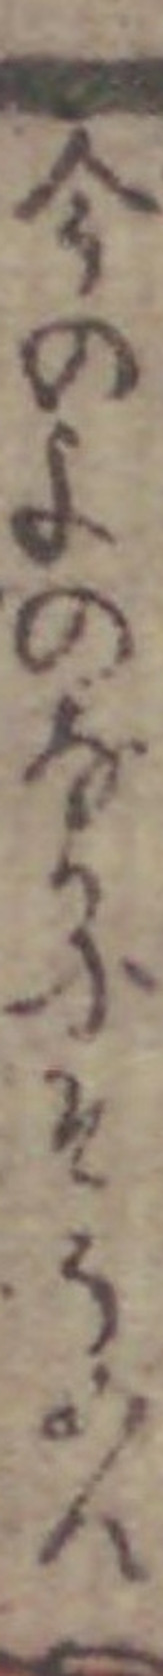今のよのなかにそうめん
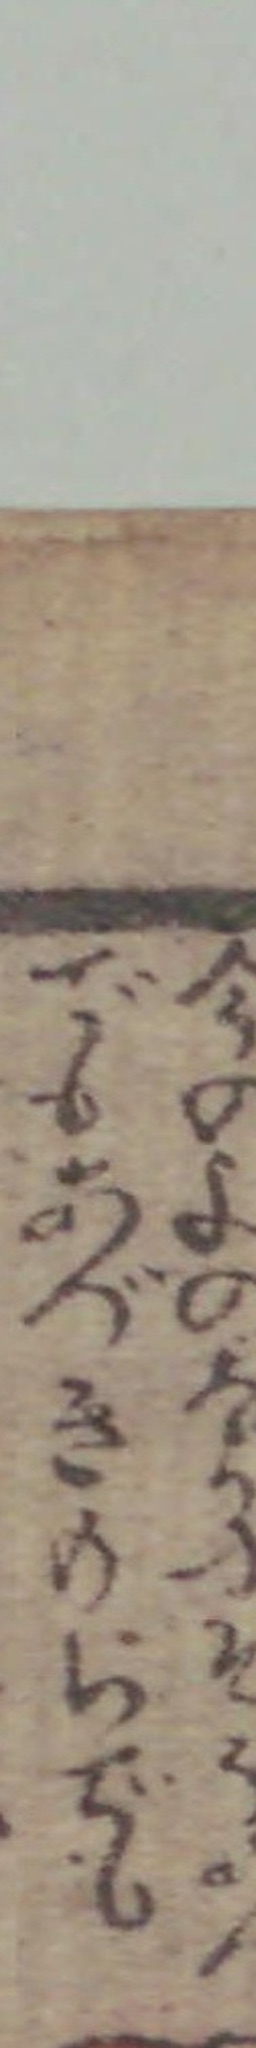でもあづきもちでも
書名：化物鼻がひしげ 2巻
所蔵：国立国会図書館 National Diet Library, JAPAN
